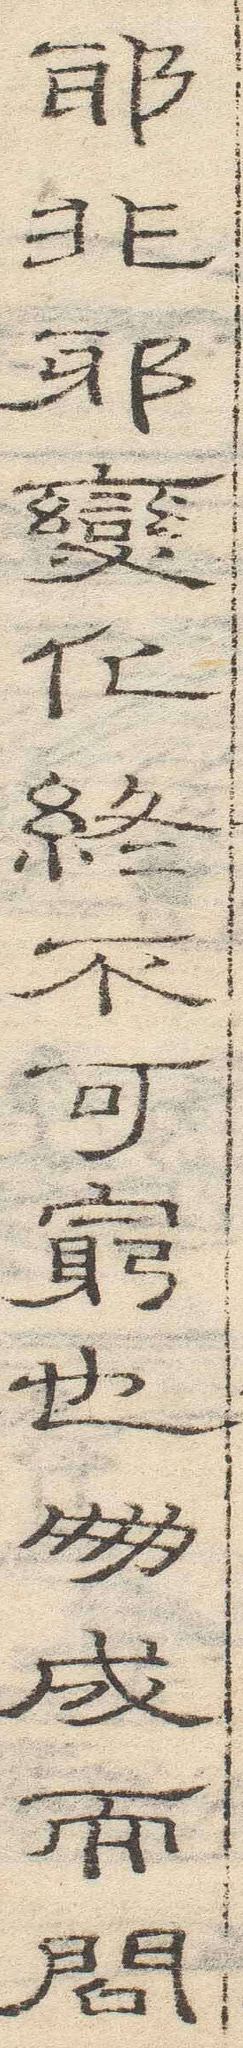耶非邪変化終不可窮也冊成而問
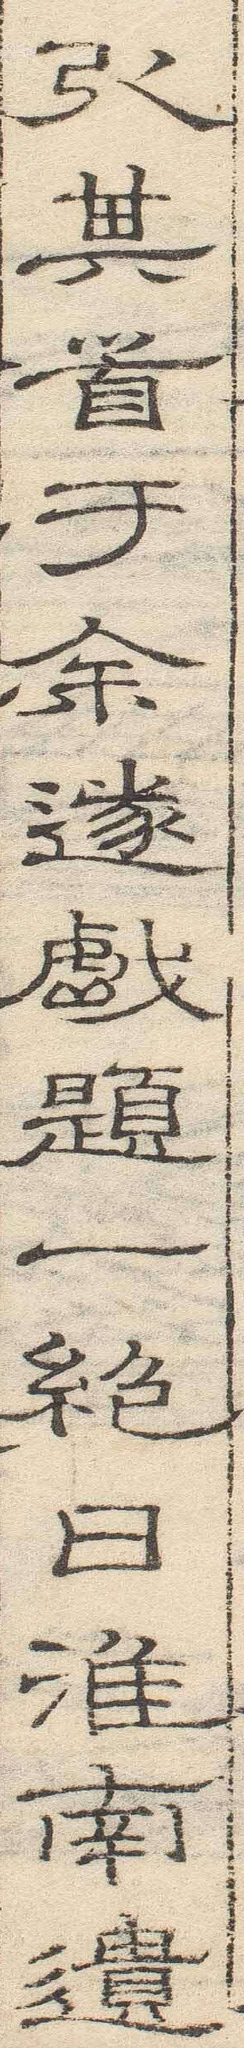弘其首于余遂戯題一絶曰淮南遺
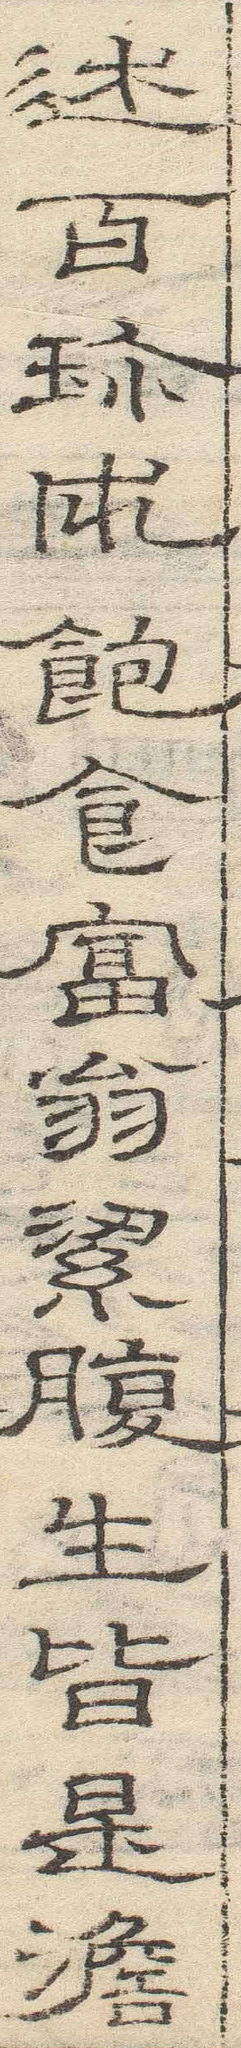述百珍成飽食富翁潔腹生皆是澹
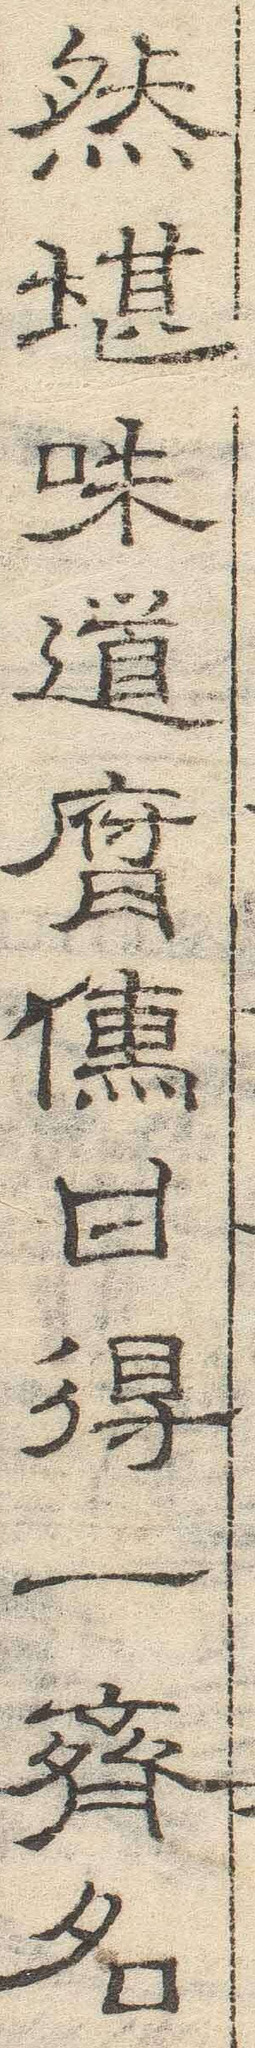然堪味道腐儒甘得一斉名
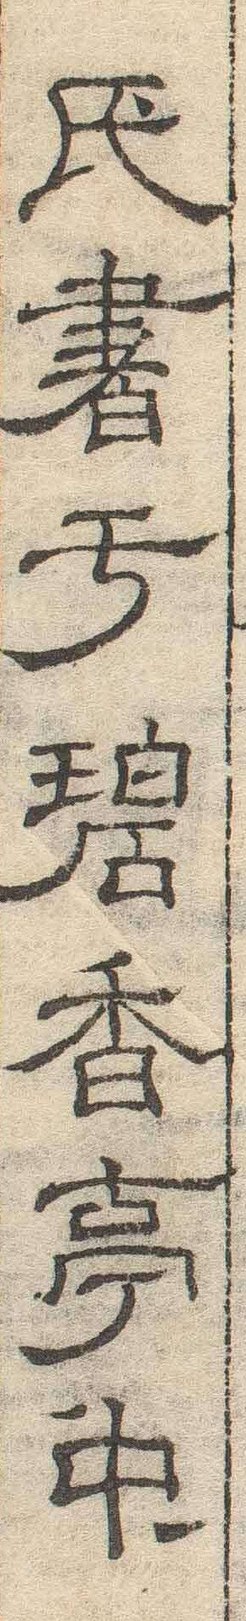氏書于碧香亭中

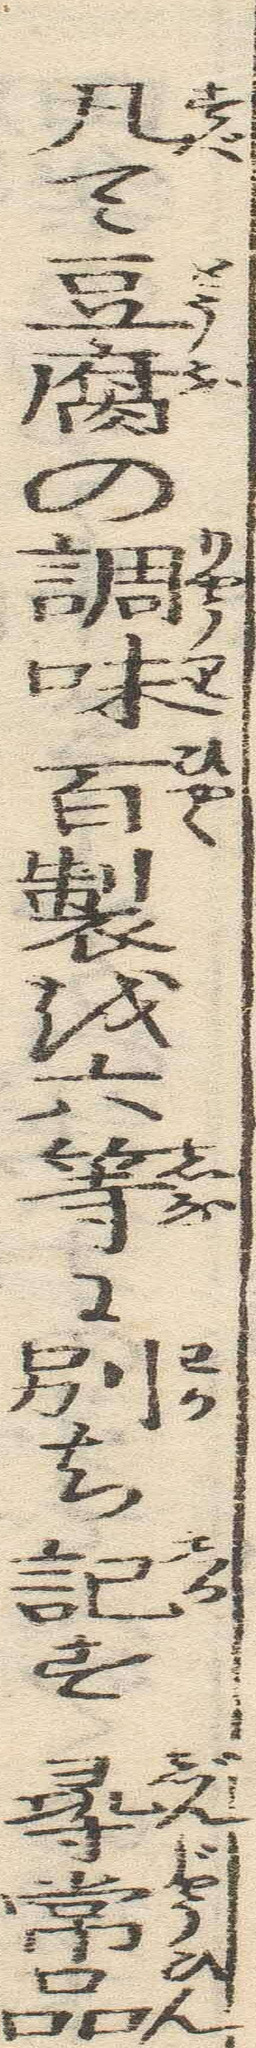一凡て豆腐の調味百製を六等に別ち記す尋常品
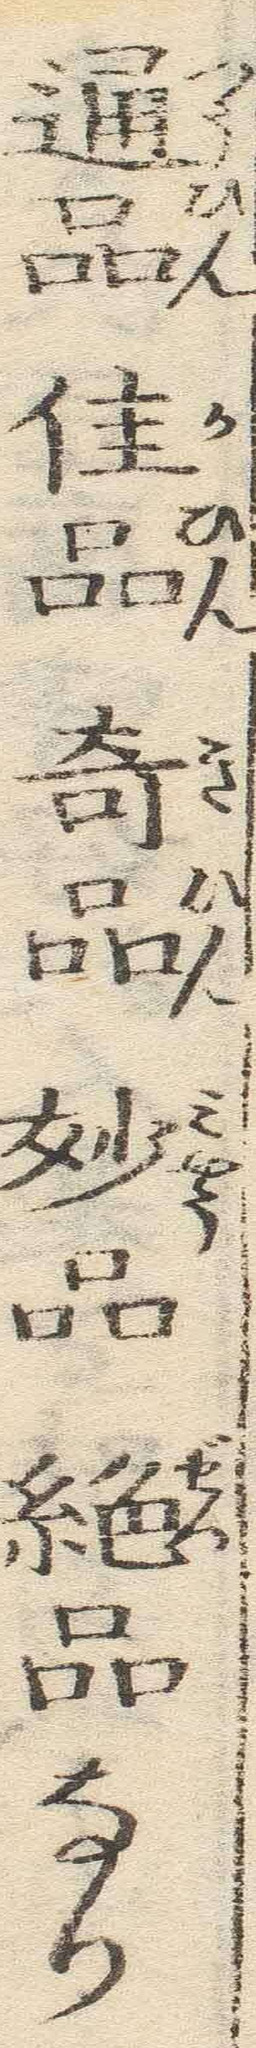通品佳品奇品妙品絶品なり
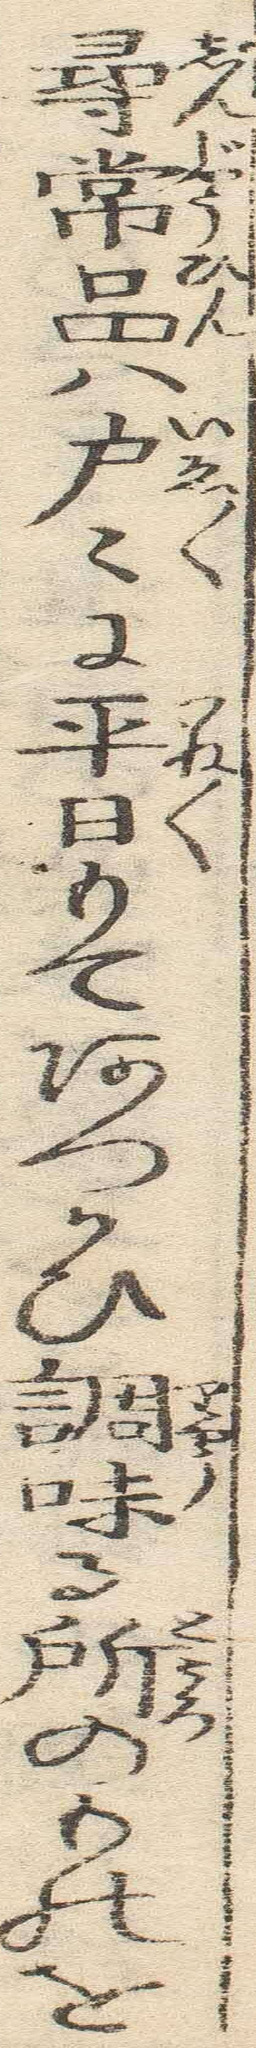一尋常品は戸々に平日もてあつかひ調味る所のものを
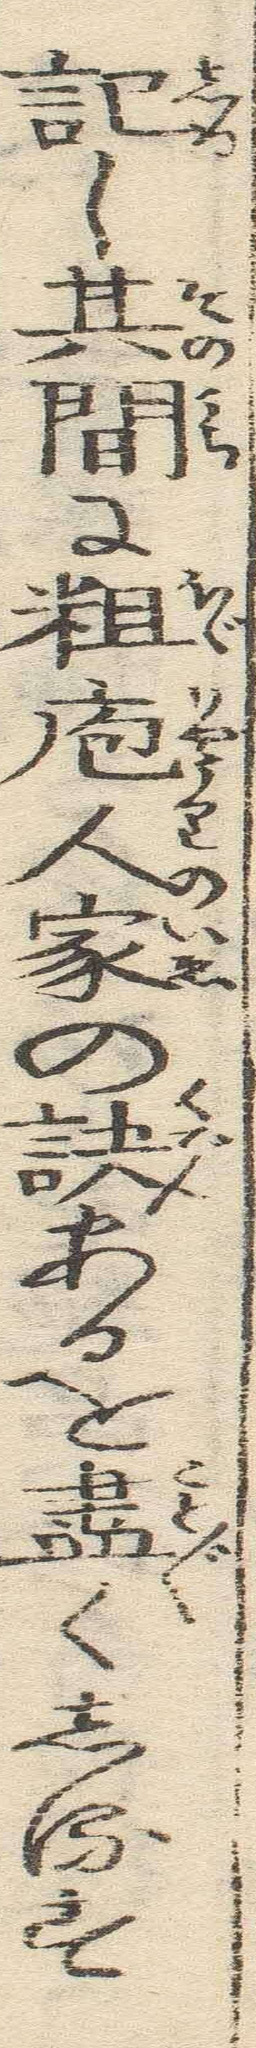記し其間に粗庖人家の訣あるを盡くしるす
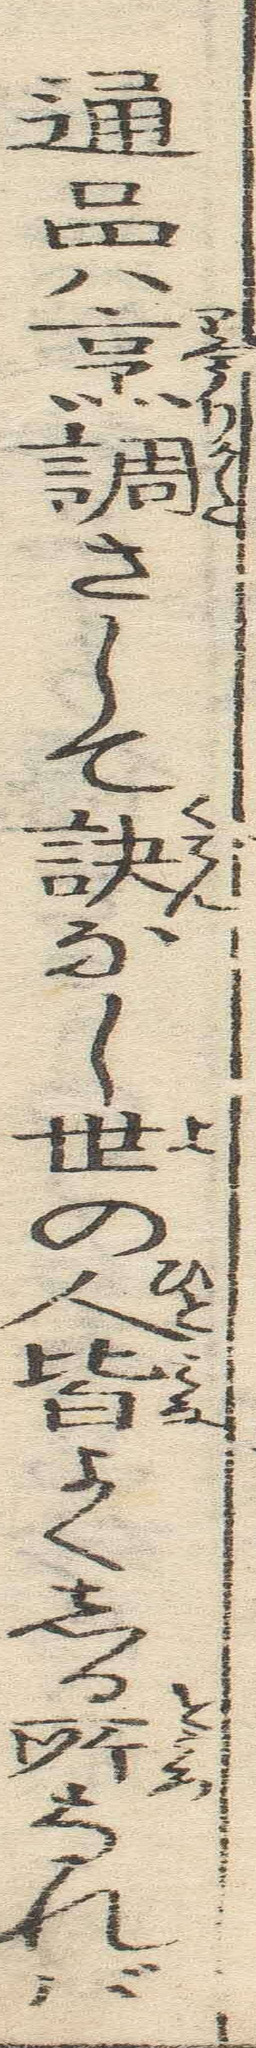一通品は烹調さして訣なし世の人皆よくしる所なれば
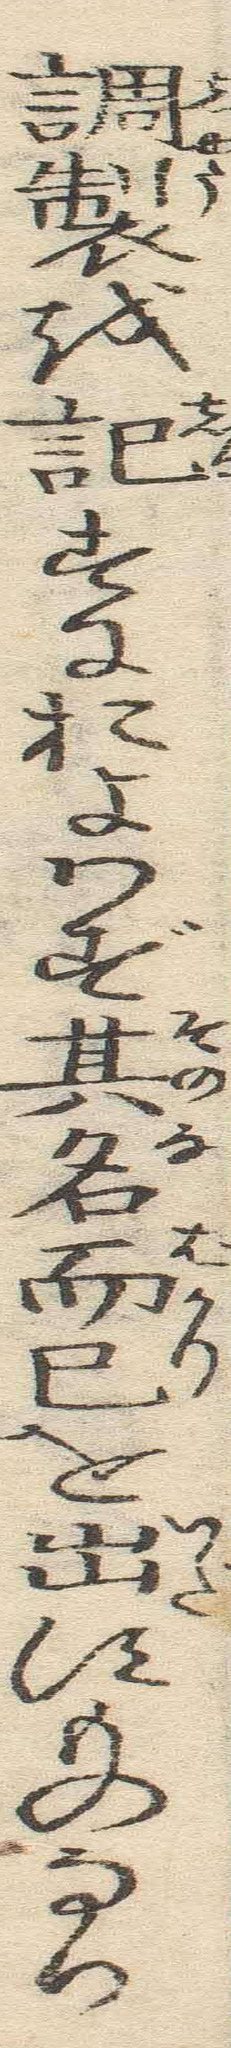調製を記すにおよはず其名而巳を出すものなり
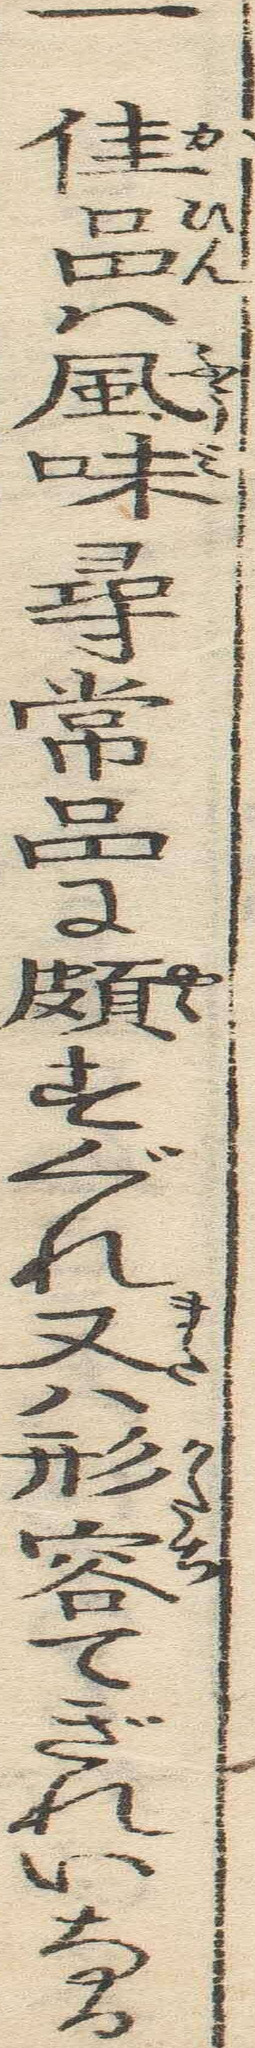一佳品は風味尋常品に頗すぐれ又は形容てぎれいなる
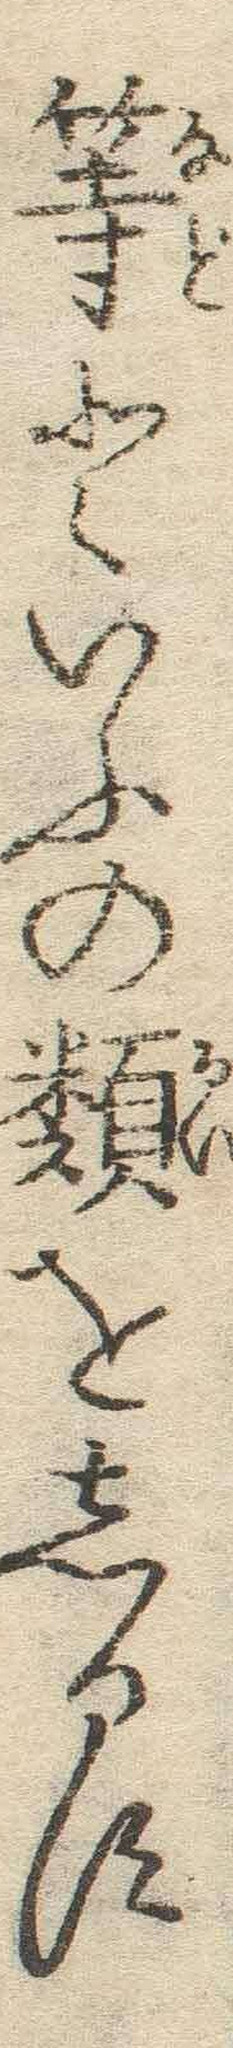等といふの類をしるす
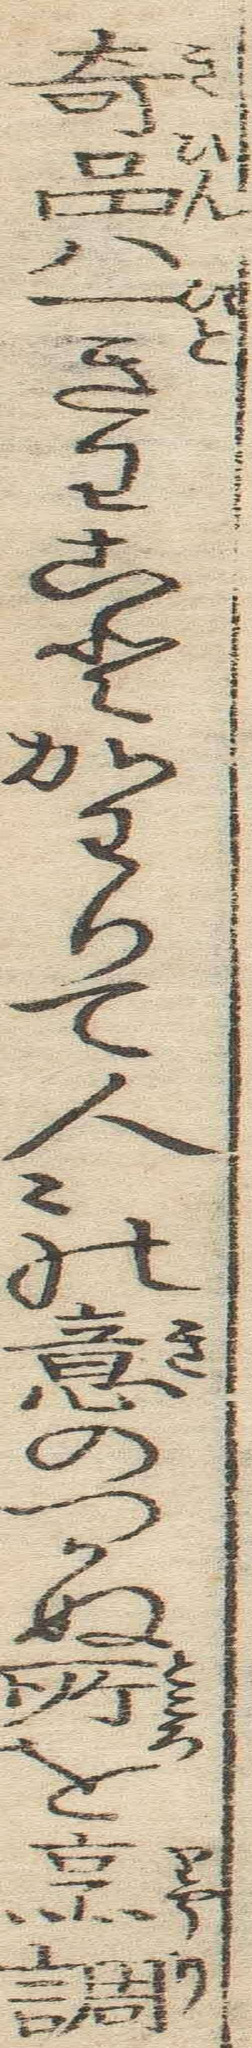一奇品は一きわことかわりて人々の意のつかぬ所を烹調

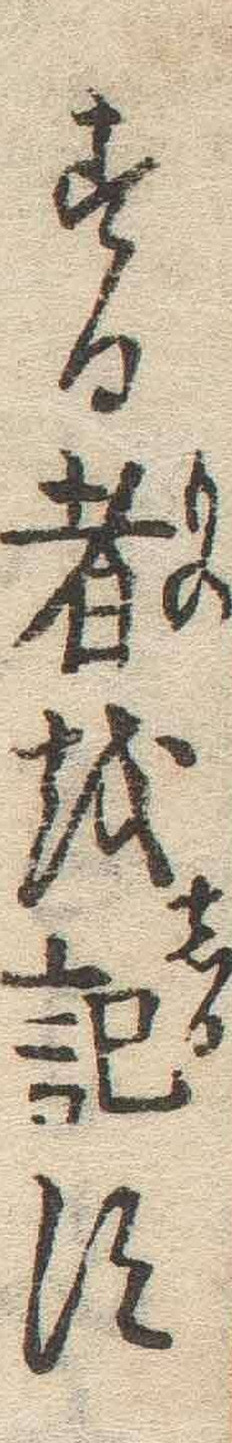する者を記す
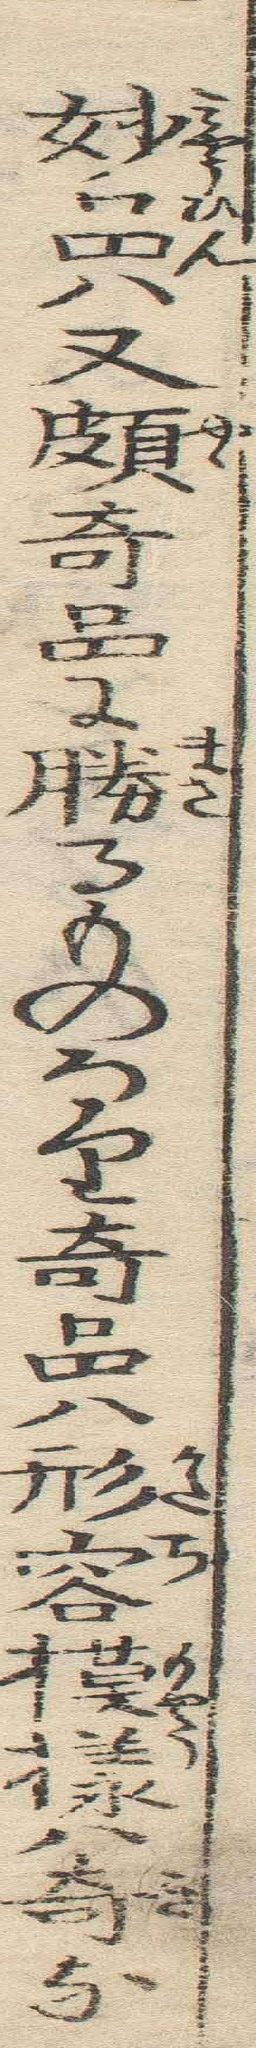一妙品は又頗奇品に勝るものなり奇品は形容模様は奇な
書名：豆腐百珍
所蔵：東京学芸大学附属図書館 国文学研究資料館
